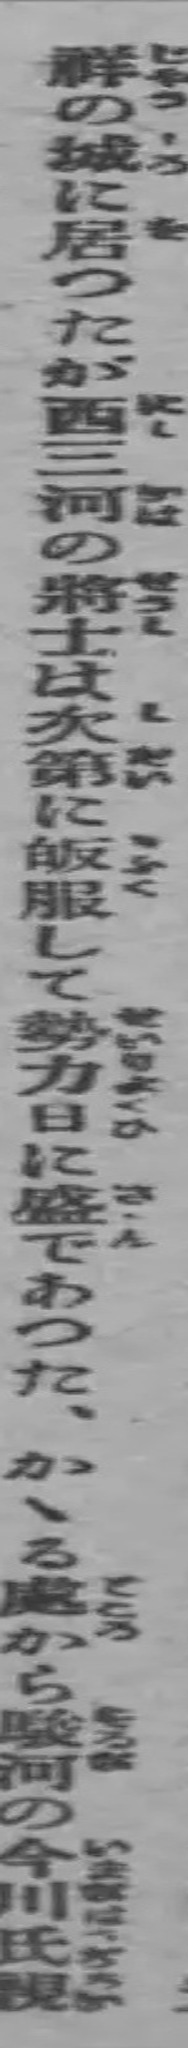祥の城に居つたが西三河の将士は次第に皈服して勢力日に盛であつた、かゝる処から駿河の今川氏親
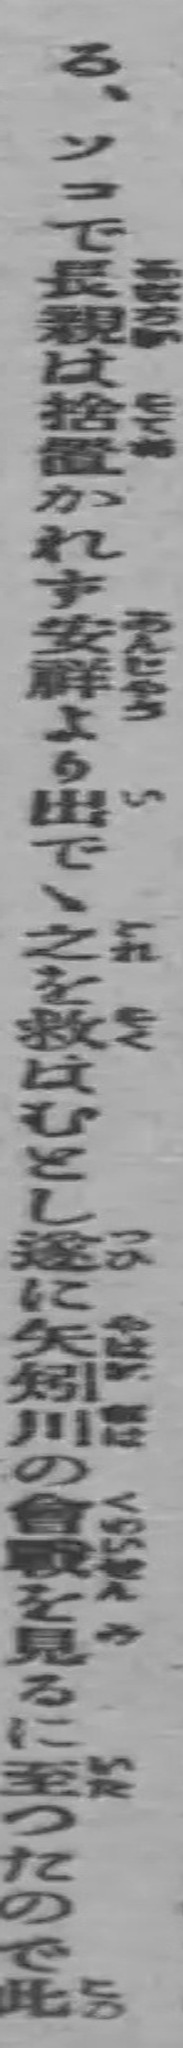る、ソコデ長親は捨置かれず安祥より出でゝ之を救はむとし遂に矢矧川の会戦を見るに至つたので此
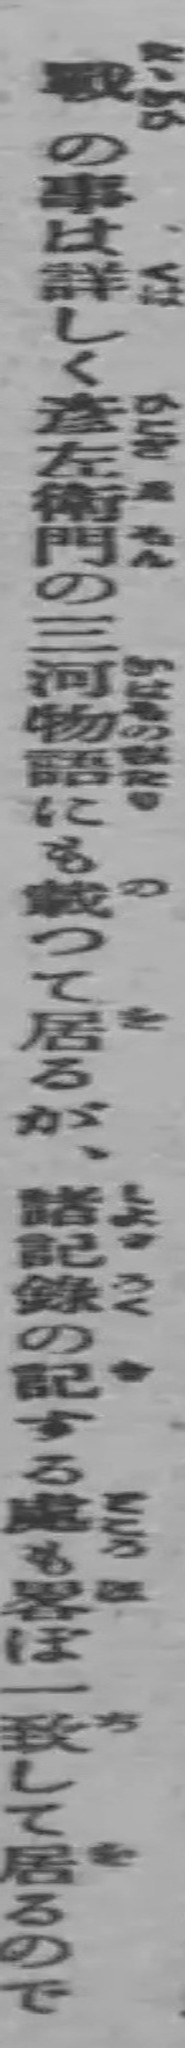戦の事は詳しく彦左衛門の三河物語にも載つて居るが、諸記録の記する処も略ぼ一致して居るので
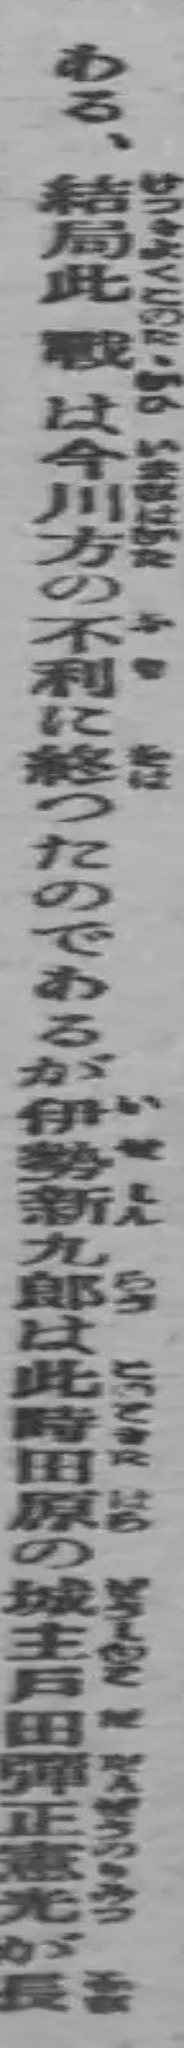ある、結局此戦は今川方の不利に終つたのであるが伊勢新九郎は此時田原の城主戸田弾正憲光が長
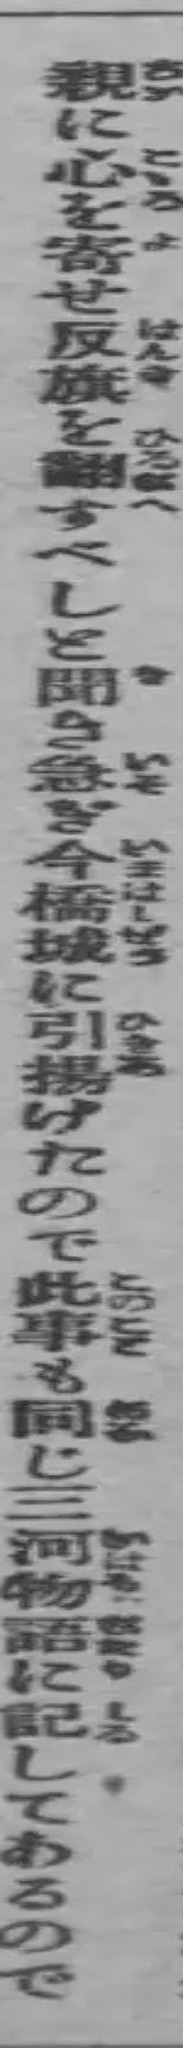親に心を寄せ反旗を翻すべしと聞き急ぎ今橋城に引揚げたので此事も同じ三河物語に記してあるので
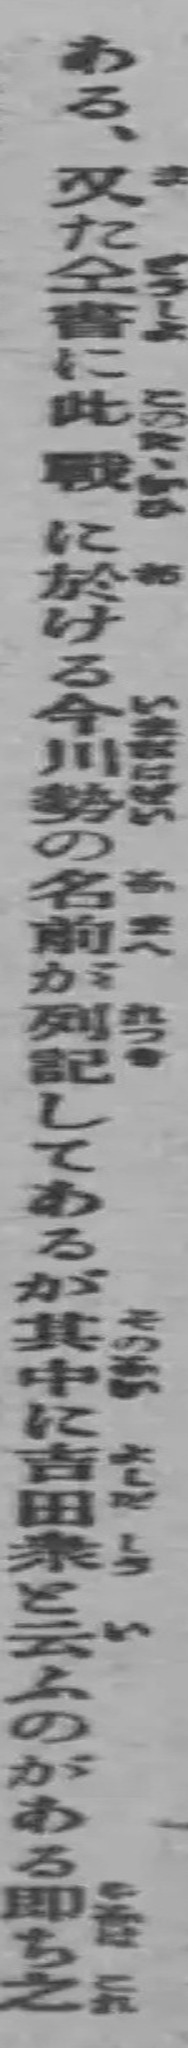ある、又た仝書に此戦に於ける今川勢の名前が列記してあるが其中に吉田衆と云ふのがある即ち之
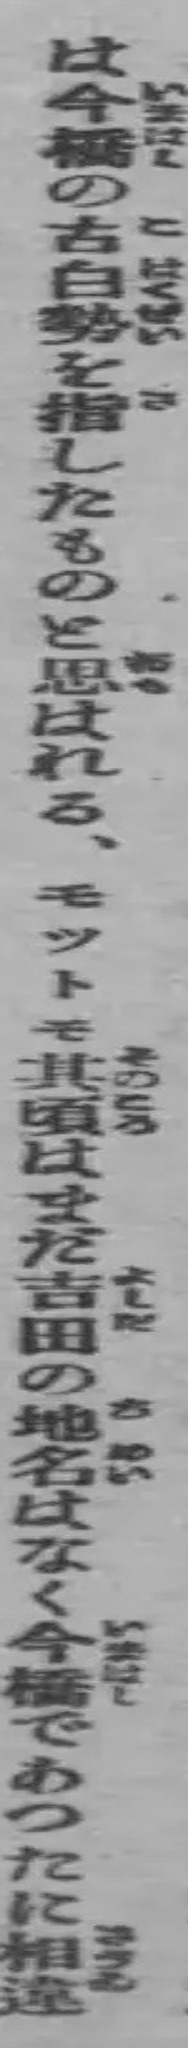は今橋の古白勢を指したものと思はれる、モツトモ其頃はまだ吉田の地名はなく今橋であつたに相違
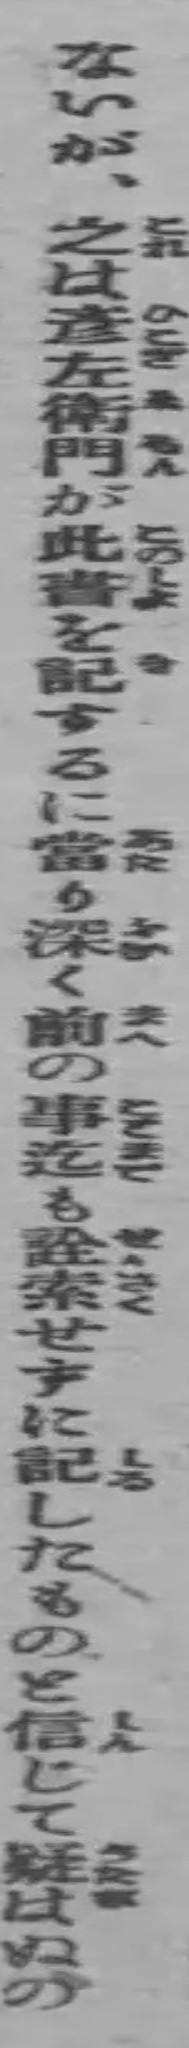ないが、之は彦左衛門が此書を記するに当り深く前の事迄も詮索せずに記したものと信じて疑はぬの
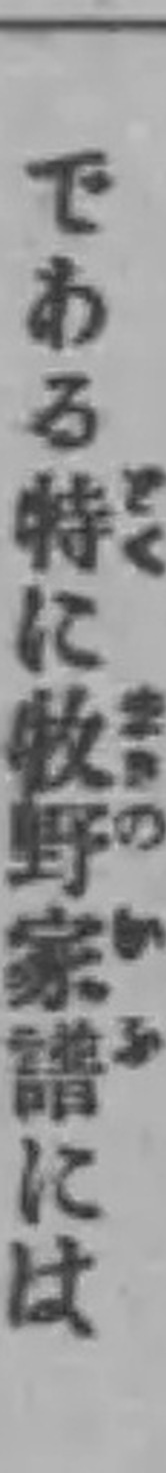である特に牧野家譜には
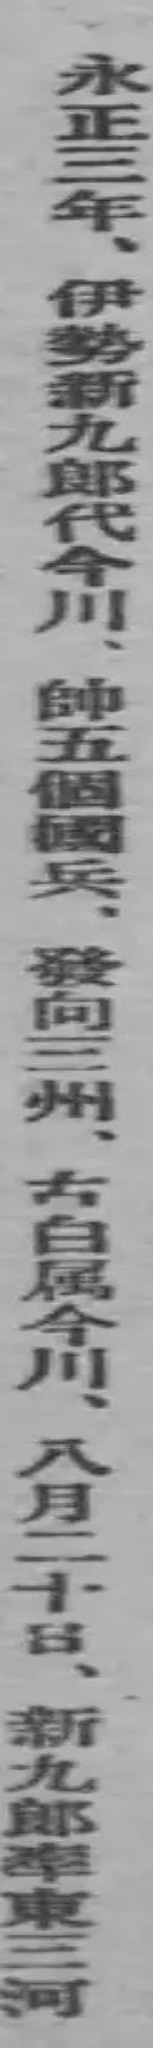永正三年、伊勢新九郎代今川、帥五個国兵、発向三州、古白属今川、八月二十日、新九郎率東三河
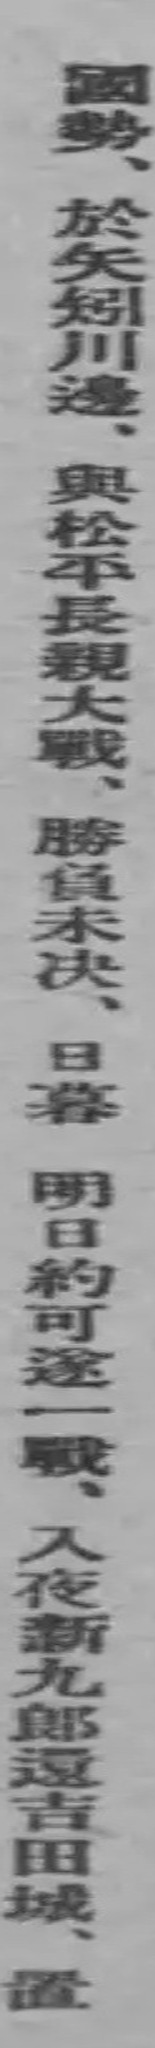国勢、於矢矧川辺、與松平長親大戦、勝負未決、日暮明日約可遂一戦、入夜新九郎還吉田城、置
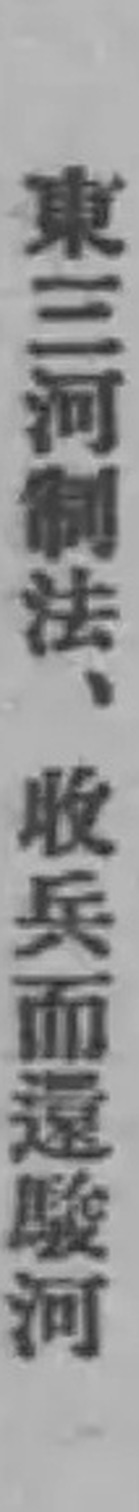東三河制法、収兵而還駿河
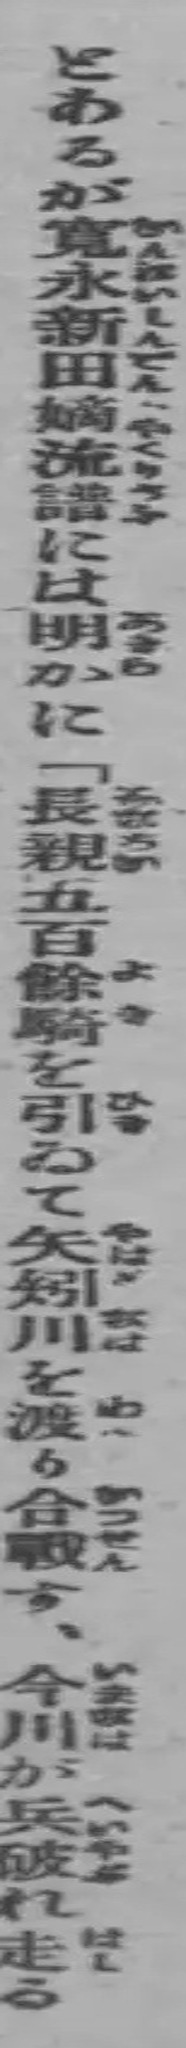とあるが寛永新田嫡流譜には明かに「長親五百余騎を引ゐて矢矧川を渡り合戦す、今川が兵破れ走る
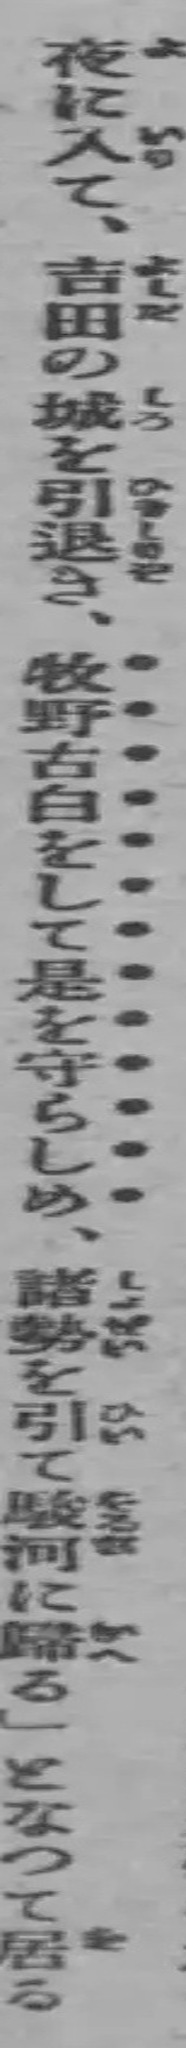夜に入て、吉田の城を引退き、牧野古白をして是を守らしめ、諸勢を引て駿河に帰る」となつて居る
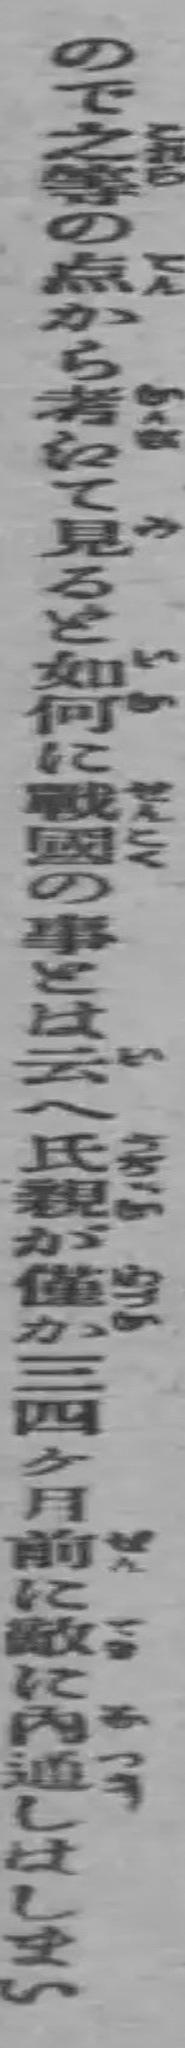ので之等の点から考えて見ると如何に戦国の事とは云へ氏親が僅か三四ケ月前に敵に内通しはしまい

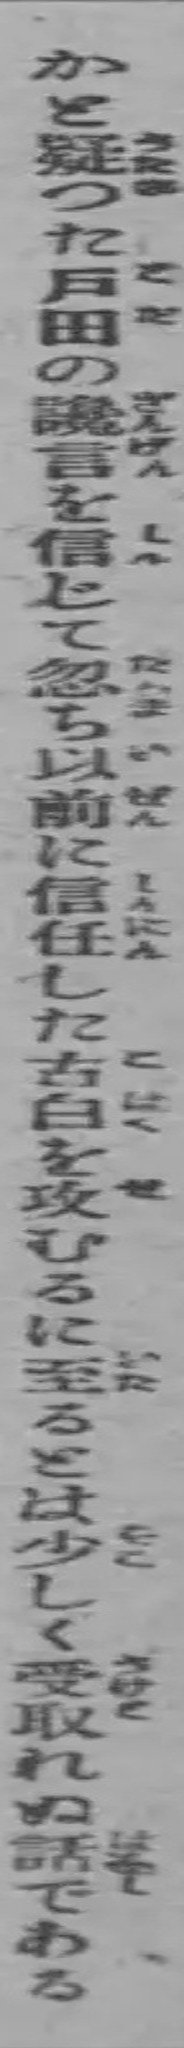かと疑つた戸田の讒言を信じて忽ち以前に信任した古白を攻むるに至るとは少しく受取れぬ話である
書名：豊橋市史談
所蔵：国立国会図書館 National Diet Library, JAPAN
